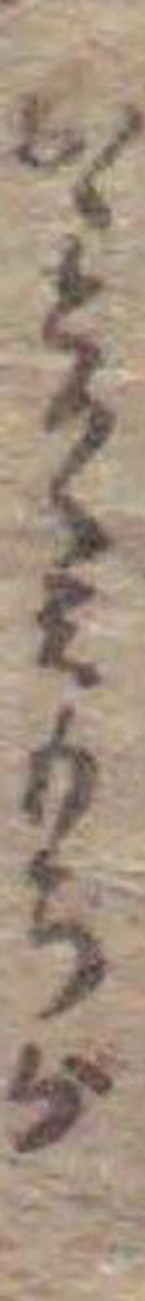おゝとかくみもちか
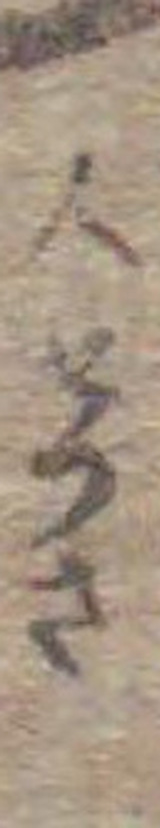大せつさ
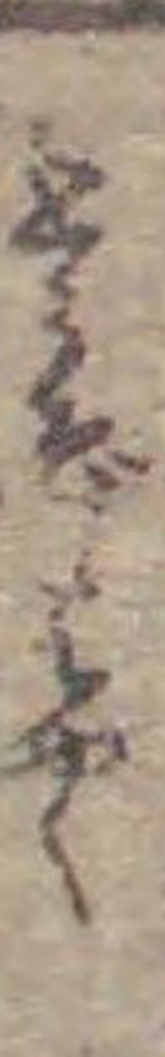とうぞはやく
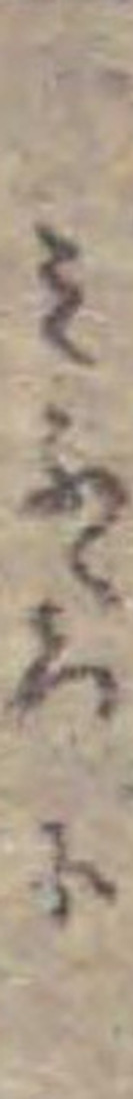みふたつに
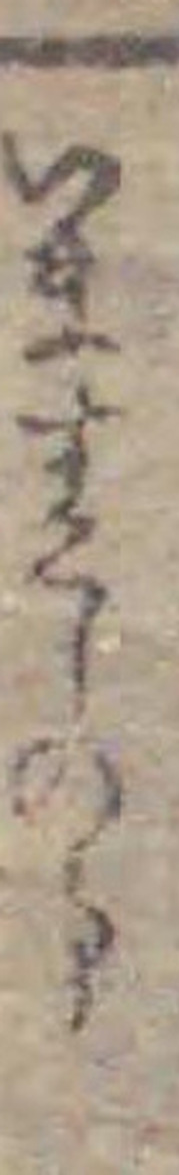いますこしの事
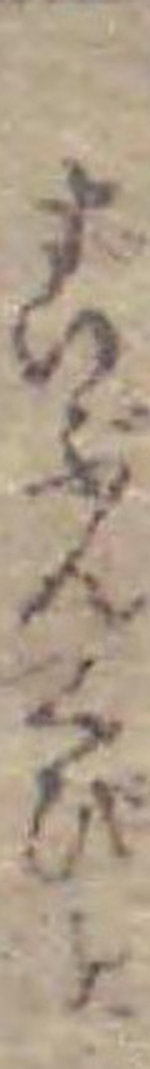ずいぶんくびを
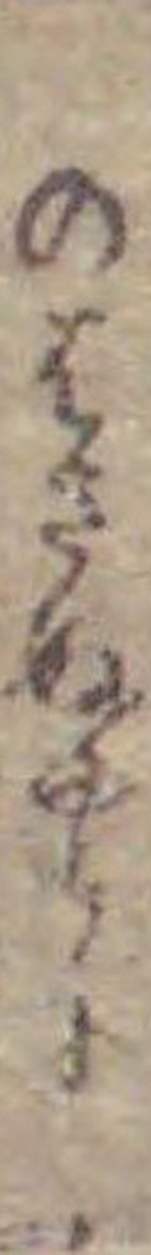のはさぬやうに
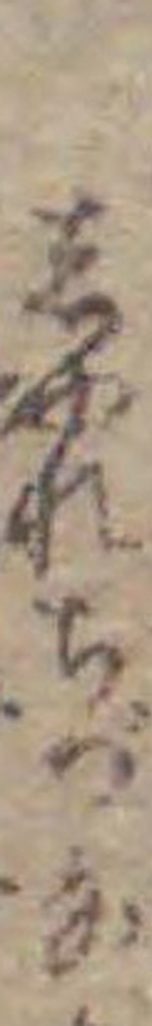しやれちづなか

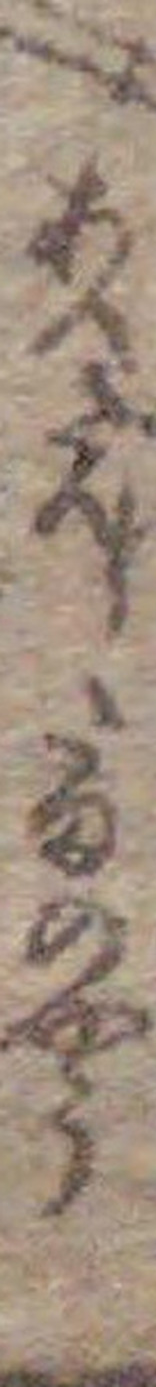あんざんしたまのやう
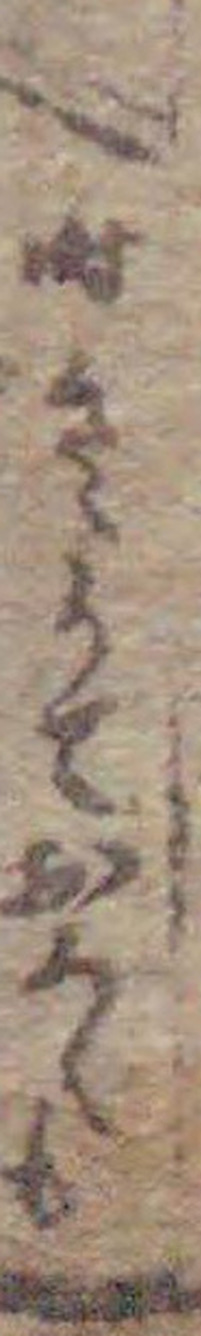時きたりておろくも
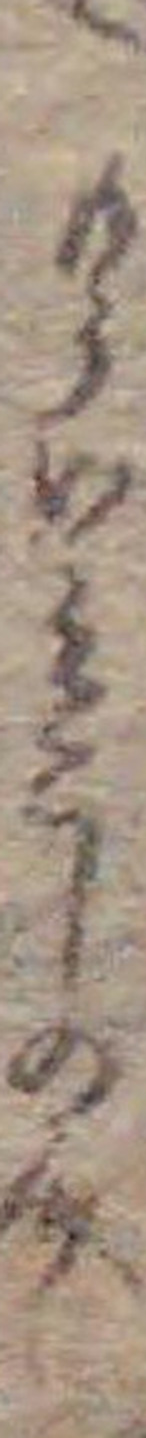もうけみこしの介
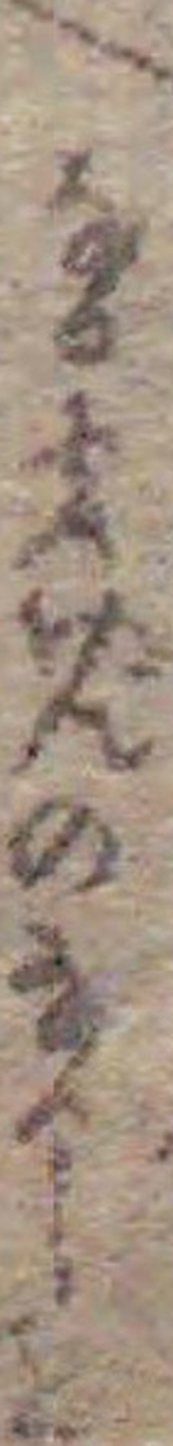なるにんげんのなんしを
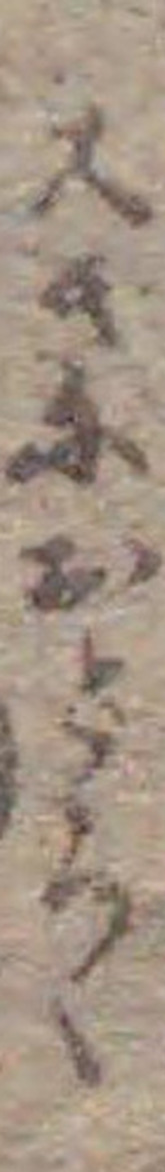大きにおとろく
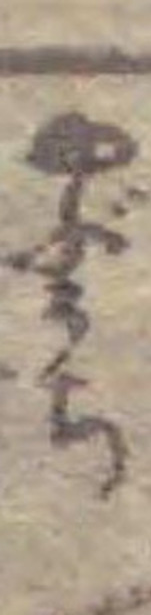やぶうち
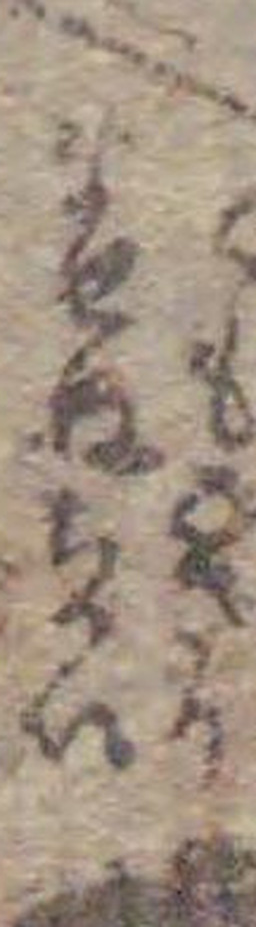ませぬちかい
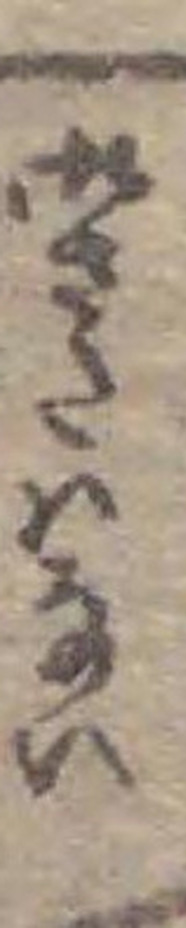御さたはない
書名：[化物一代記] : 5巻
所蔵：国立国会図書館 National Diet Library, JAPAN
